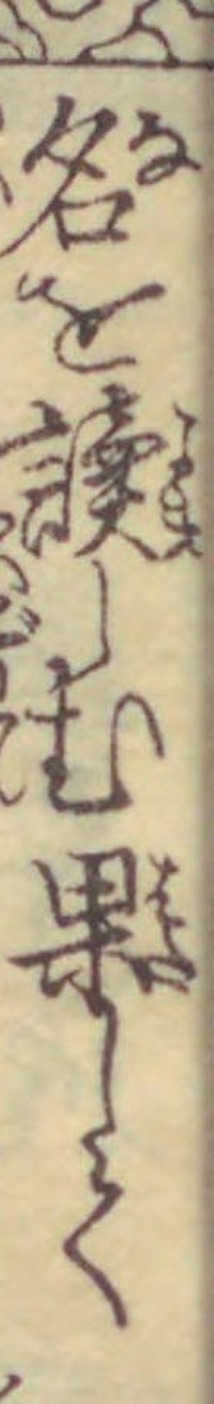名を読しむ果して
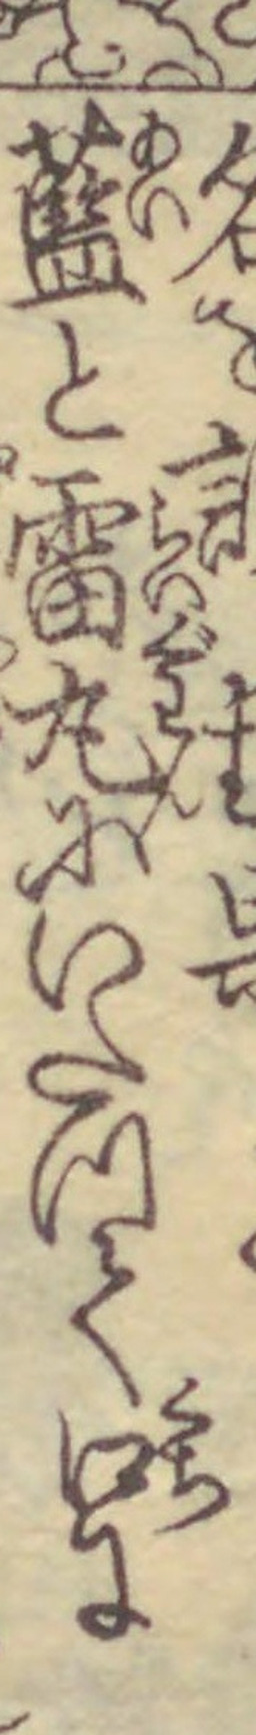藍と雷丸にいたつて口に
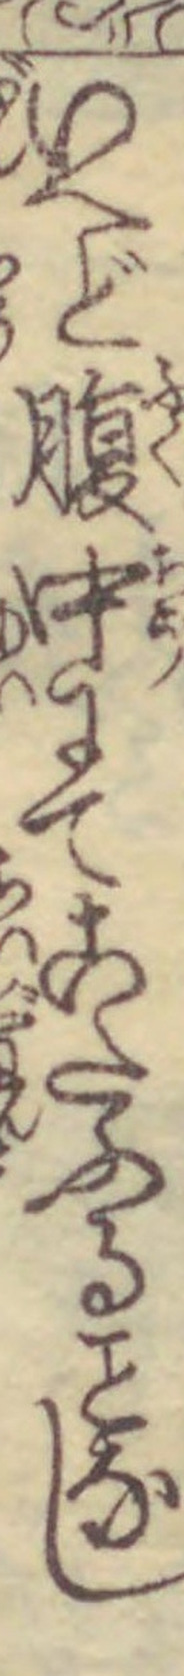いへど腹中にてこたふることなし
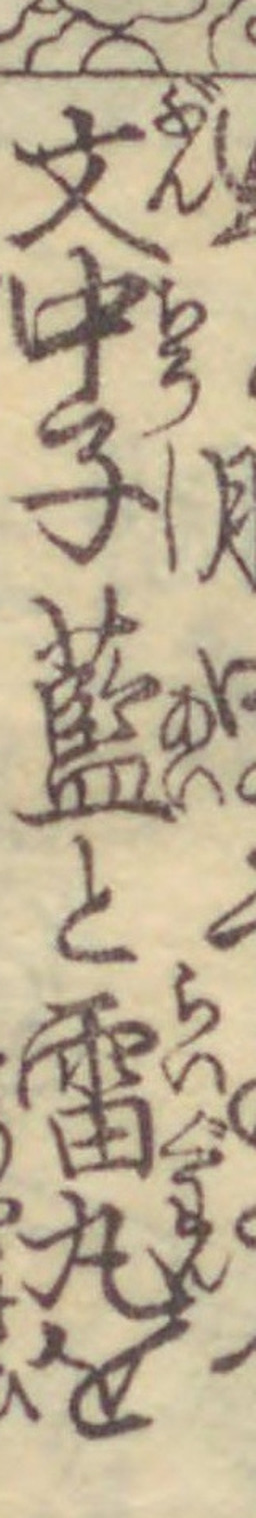文中子藍と雷丸を
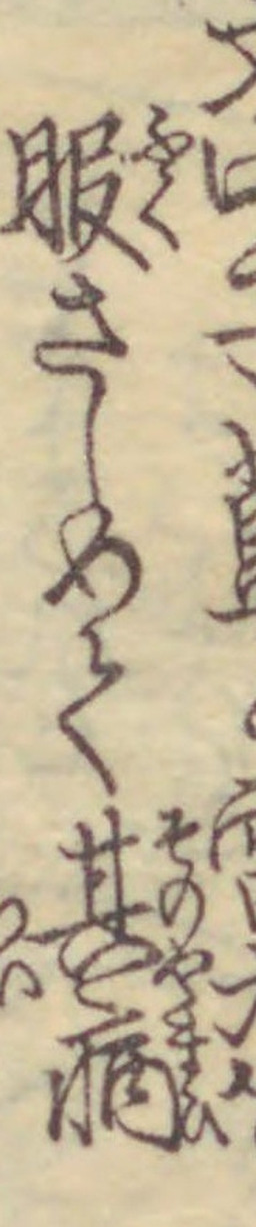服さしめて其病

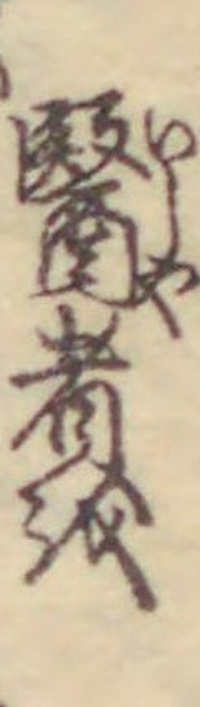医者を
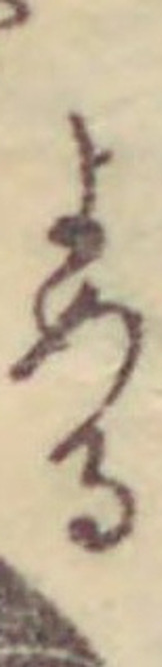よめる
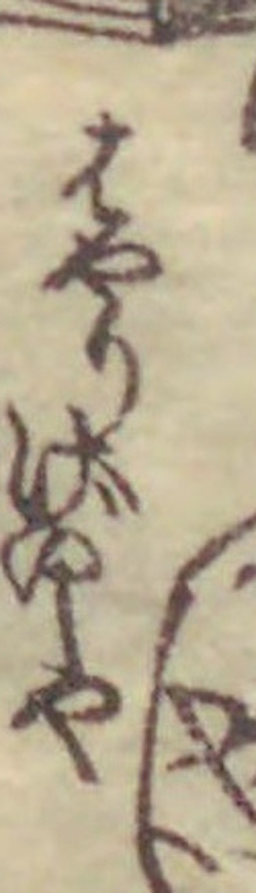はやりげいしや
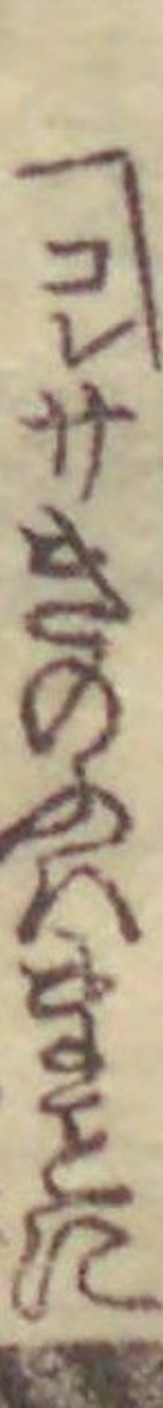〽コレサきのふはまことに
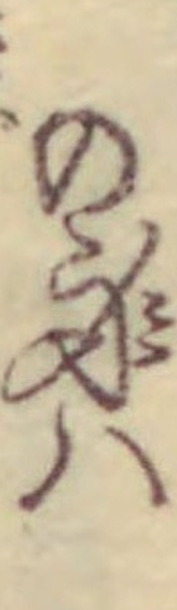の身は
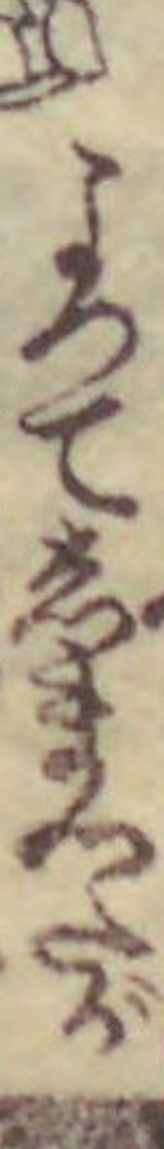よつてしまつたが
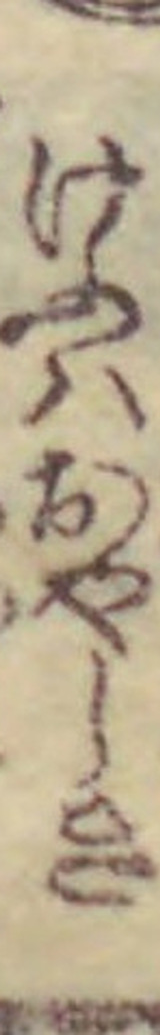けふはおやしき
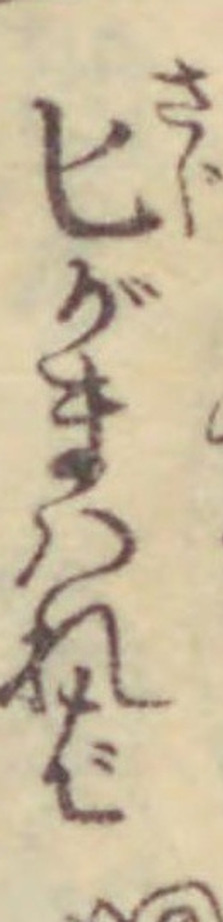匕がまはれば
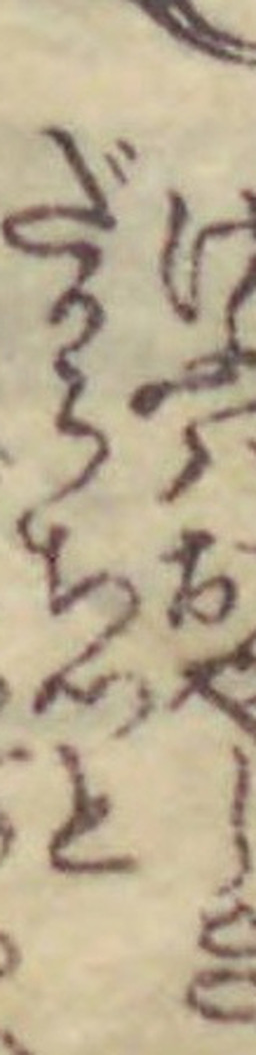だからちつと
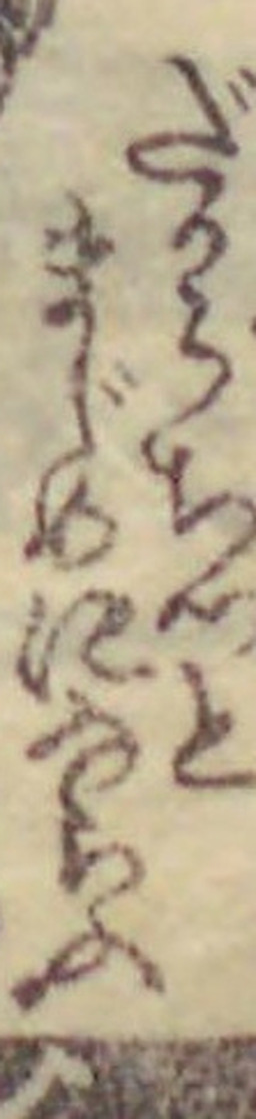まじめにならふ
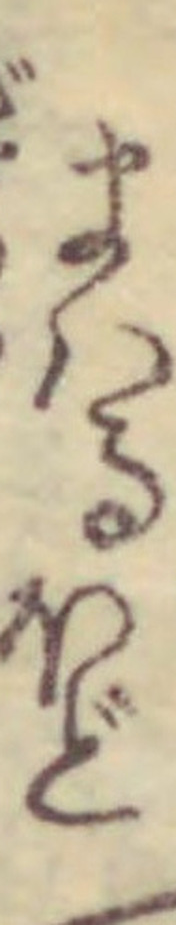まはるほど
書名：腹内窺機関 2巻
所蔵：国立国会図書館 National Diet Library, JAPAN
